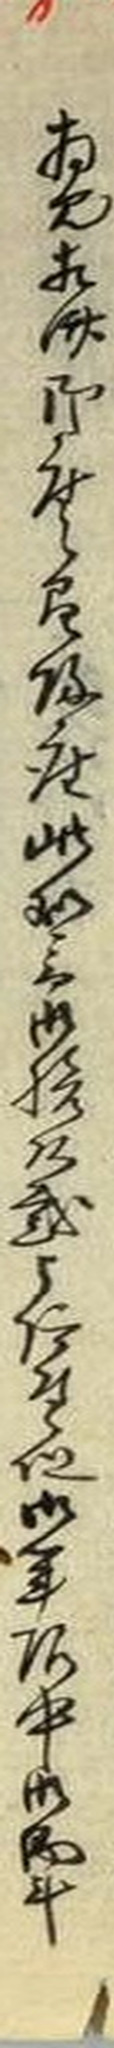拝見相済御座之間へ帰座此処ニ而御膳頂戴被仰付候但御年限中御酒斗
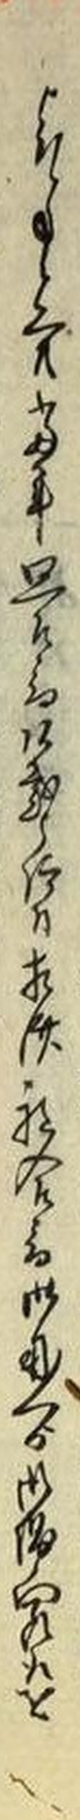被下候事ニ候へ共当年思召ニ而頂戴被仰付相済程合ニ而御用人ゟ御側向頭取を
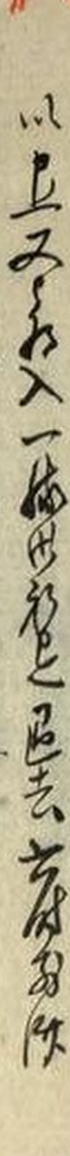以申上又被為入一統御礼申上退去六時前済
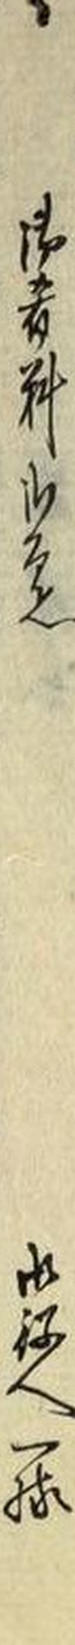御肴料弐百疋御役人一統
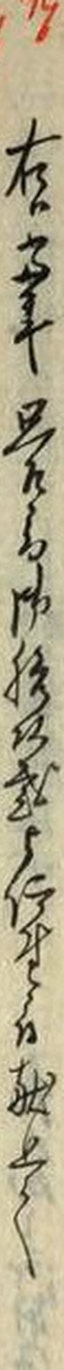右ハ当年思召ニ而御膳頂戴被仰付候ニ付献上之
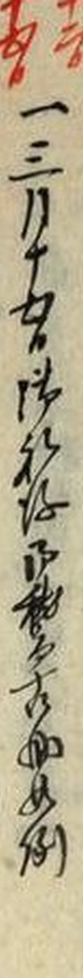一三月十五日御礼後御稽古納如例
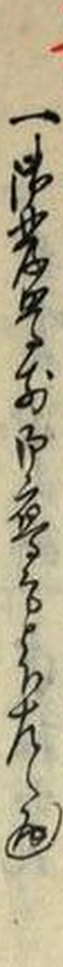一御発駕前御鷹方へ被下左之通
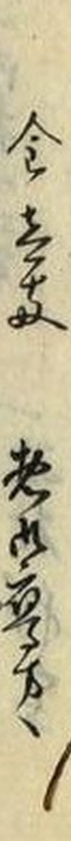金壱両惣御鷹方へ
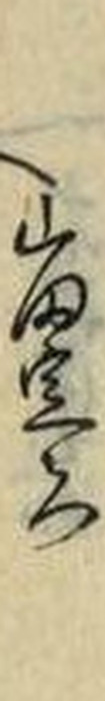山田定右衛門
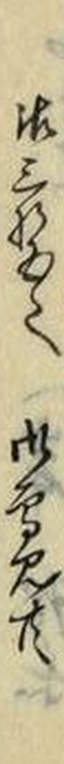銀三拾五匁御鳥見共へ

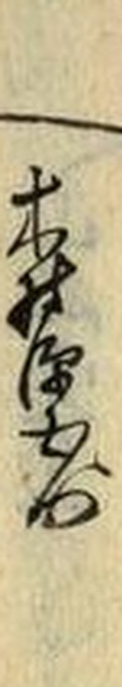木村源五右衛門
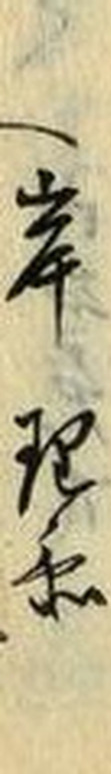岸理兵衛
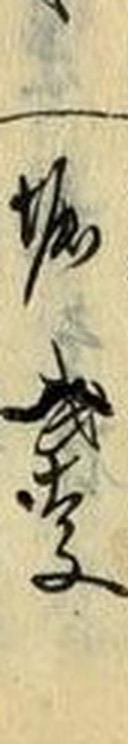堀武太夫
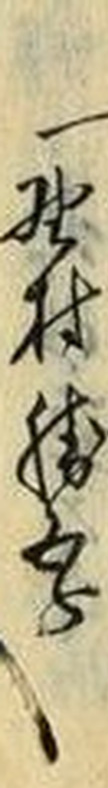野村勝五郎
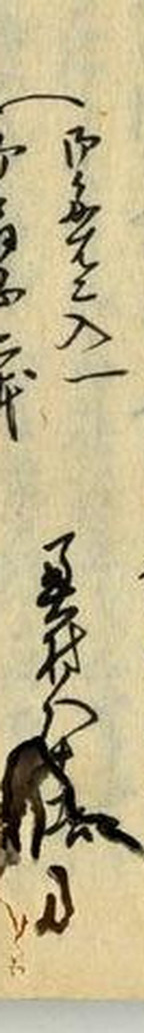御扇子二本奥村八十吉
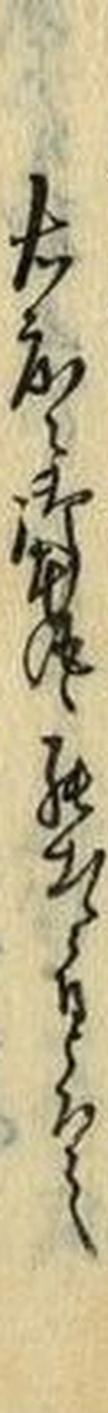右度々御本丸へ罷出候ニ付被下之
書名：少傅日録抄（斉承付側向頭取日記、在国）
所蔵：福井県文書館 Fukui Prefectural Archives
